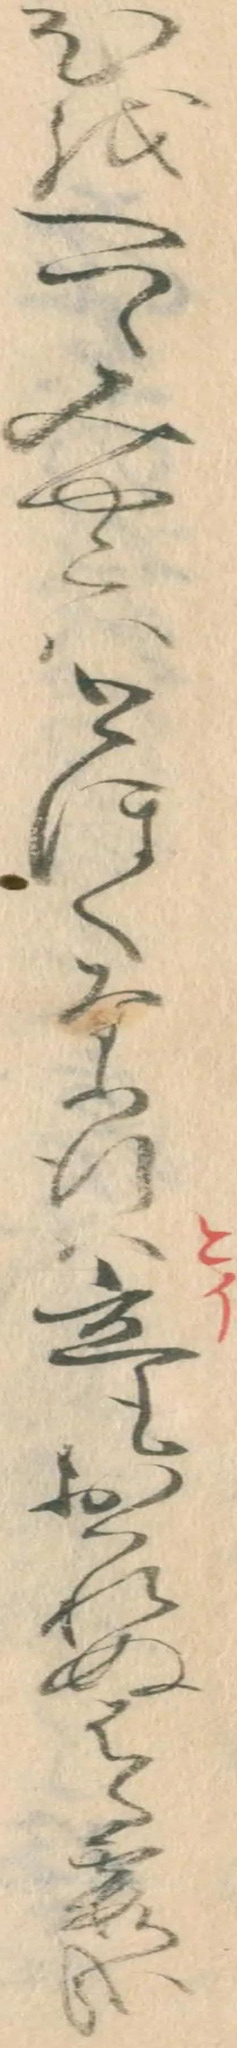ひをへつゝみやこはとほくなり行は立もおくれぬはる霞哉

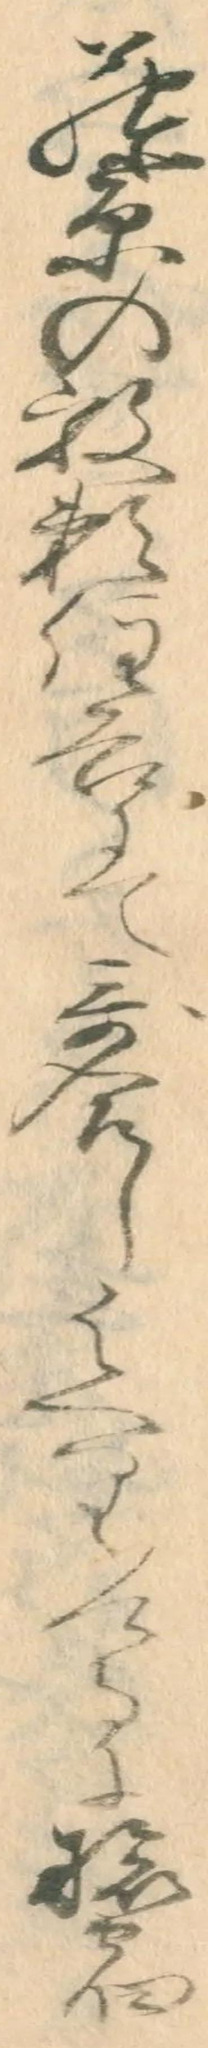藤原の敦頼住居にて歌合しはへりけるに旅宿
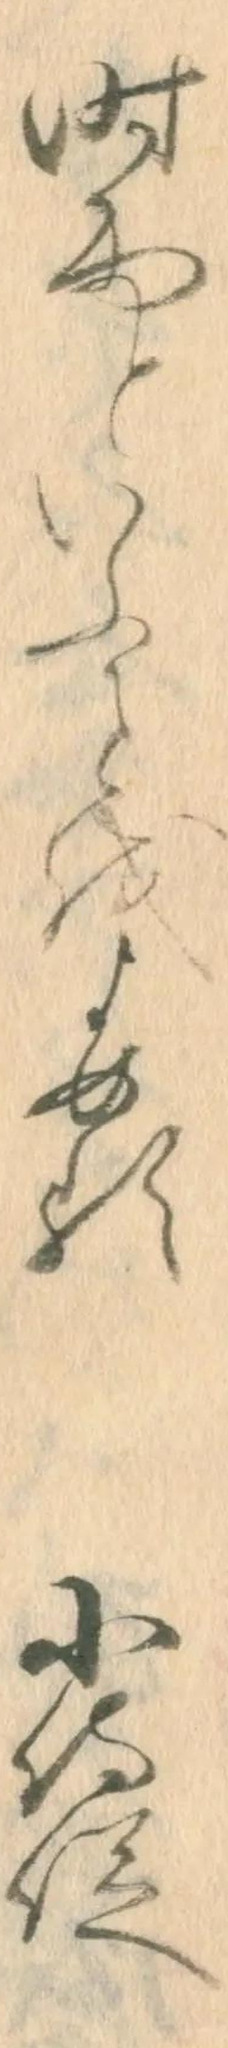時雨といふことをよめる小侍従
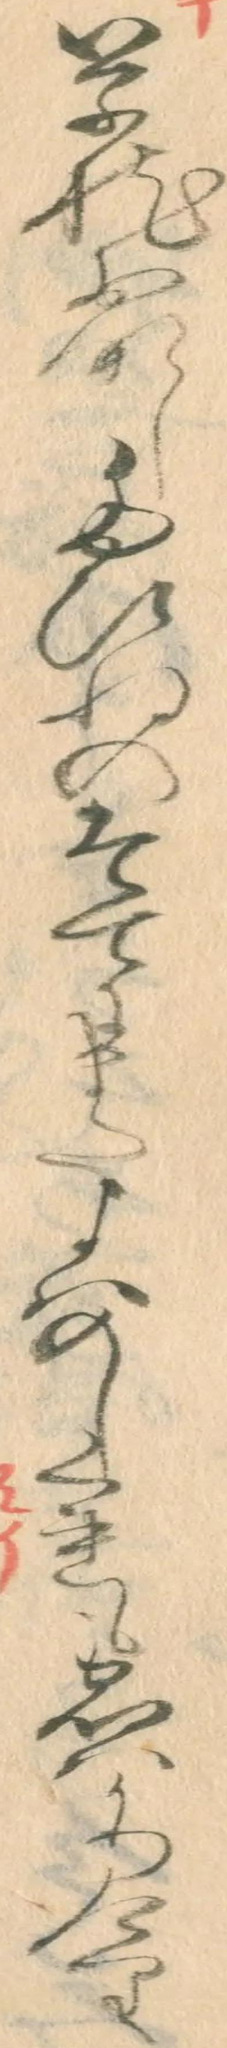草枕おなしたひねのそてにまたよはのしくれも宿はかりけり
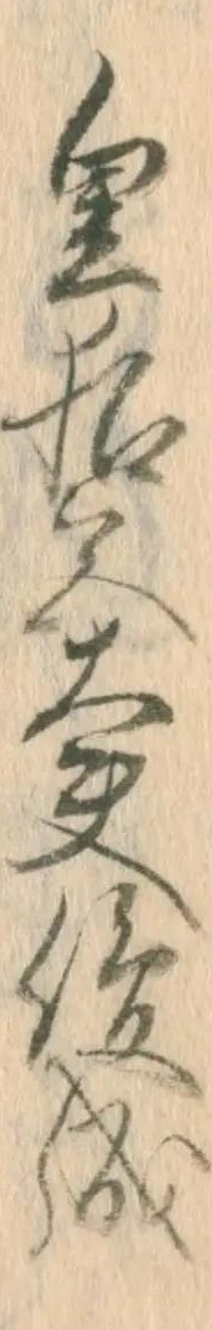皇后宮大夫俊成
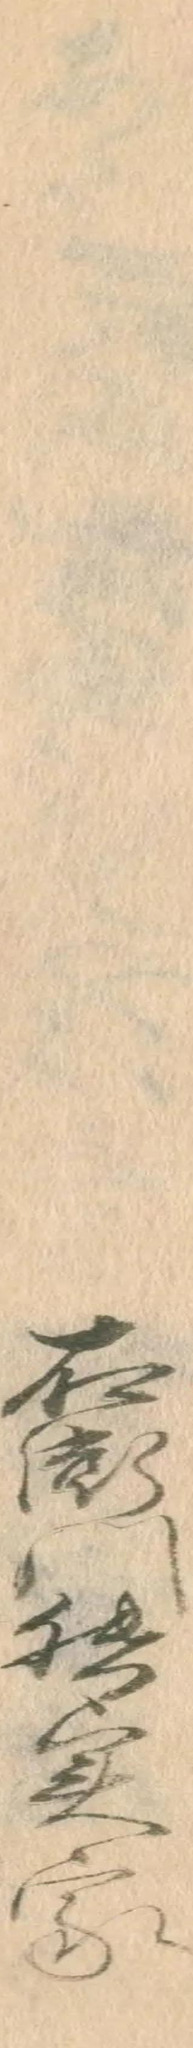右衛門督実家
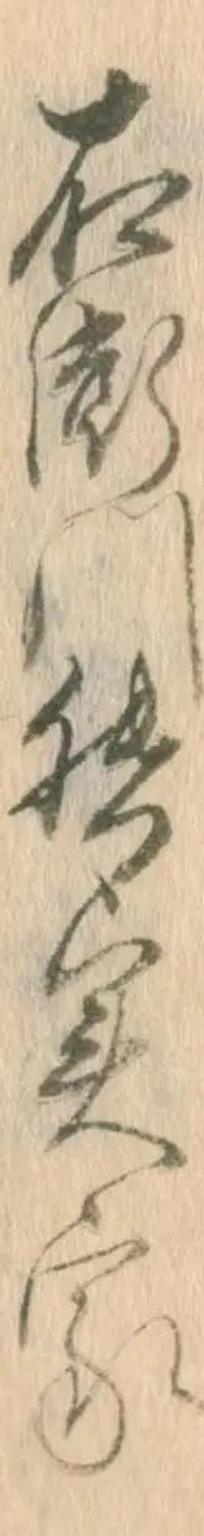右衛門督実家
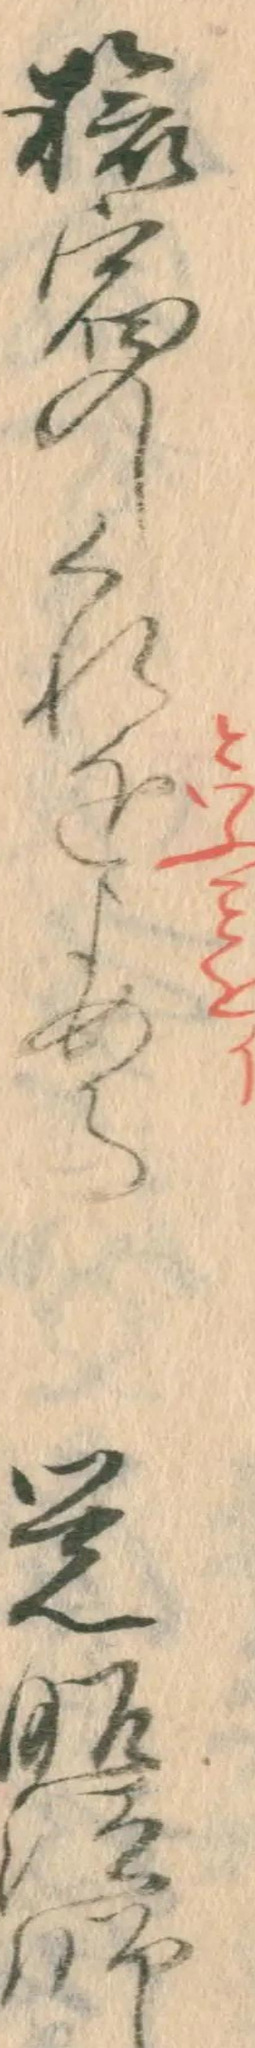旅宿のしくれをよめる覚昭法師
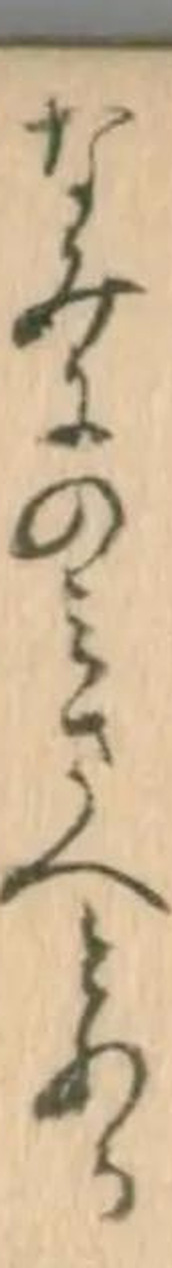なみにのみさへとある
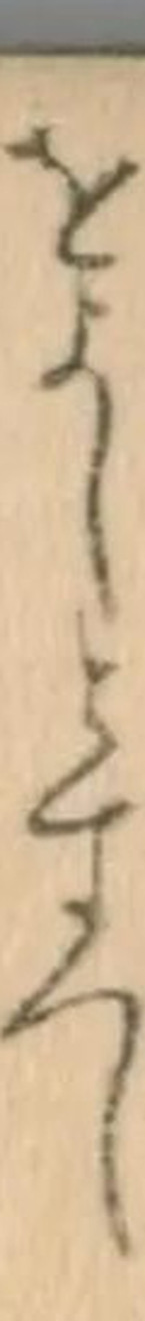をよしとすへし
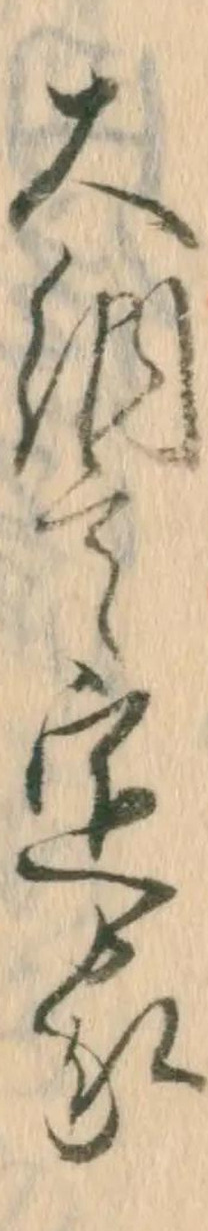大納言定家
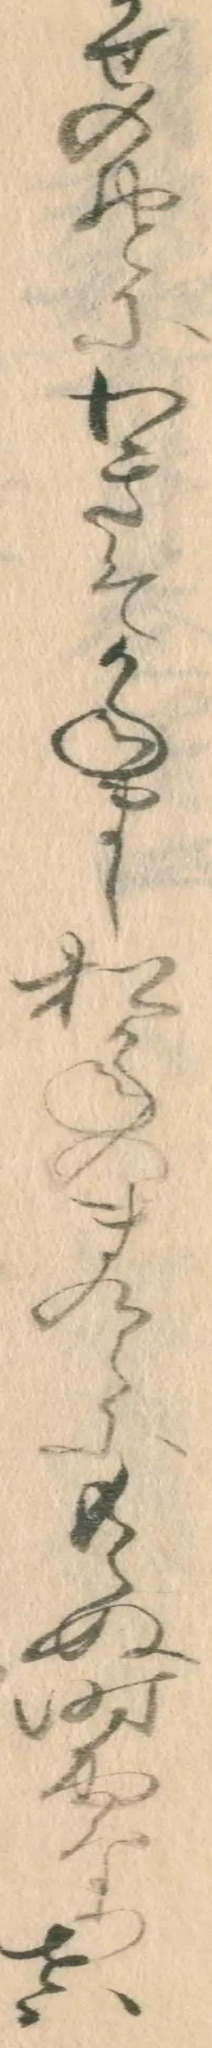かせのおとにわきそかねまし松かねのまくらにもらぬしくれなりせは
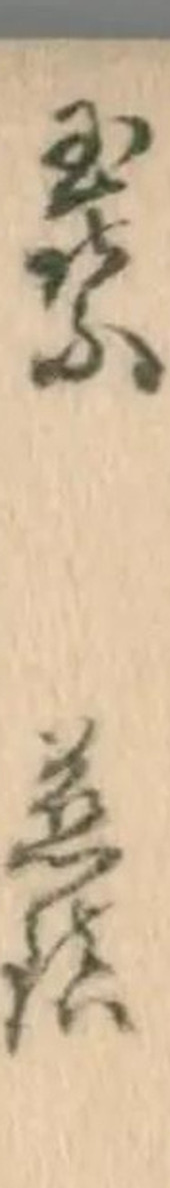玉葉慈鎮
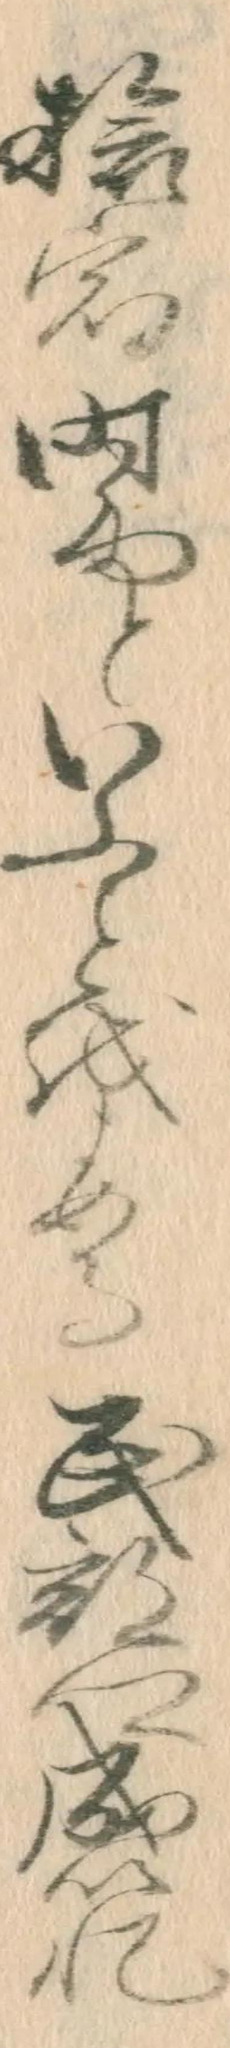旅宿時雨といふことをよめる民部卿成範
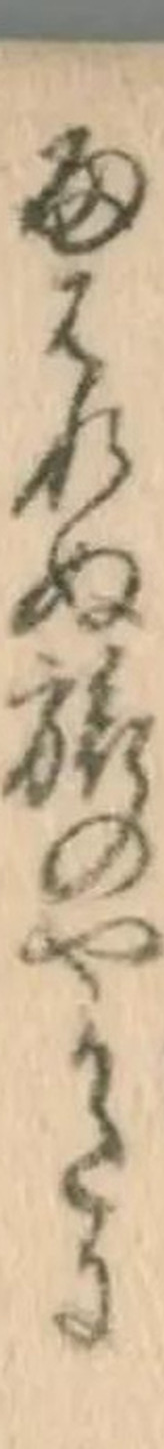雨はれぬ旅のやかたに
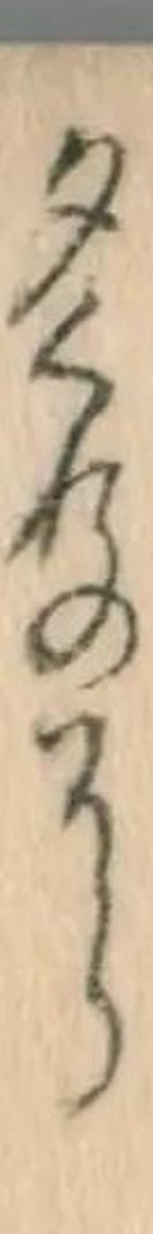夕くれのそら
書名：月詣和歌集
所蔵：国立国会図書館 National Diet Library, JAPAN
